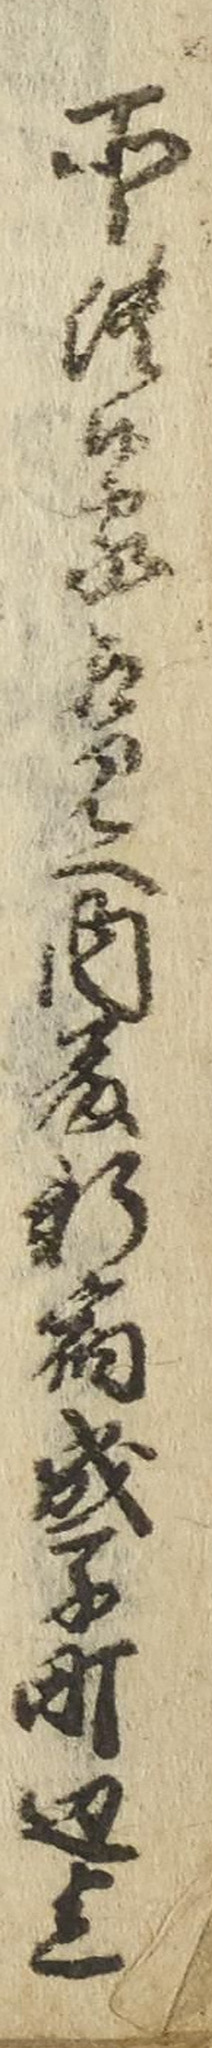所々潰候家は見へ内藤新宿成子町辺迄
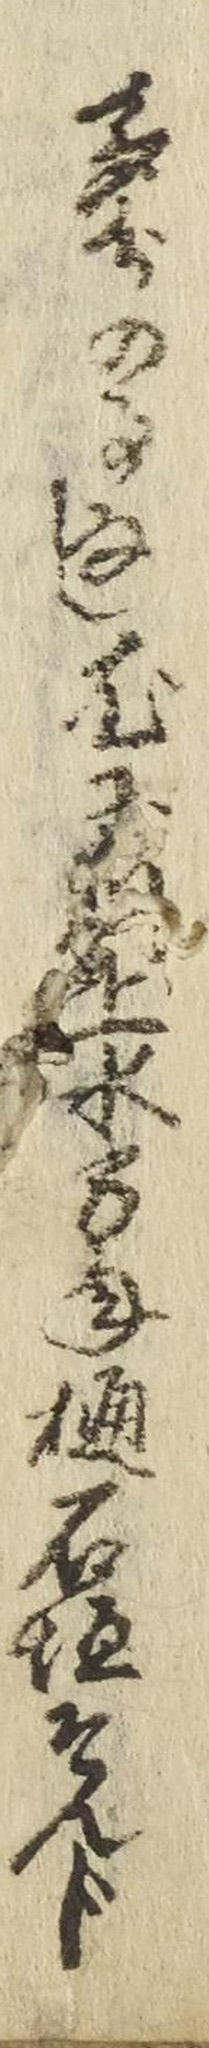多分の事なし尤玉川上水万年樋石垣そんじ
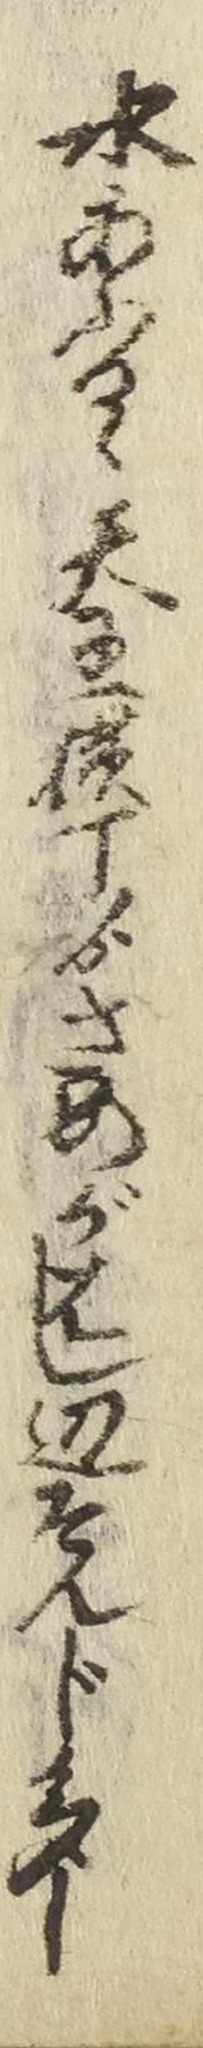水あふるゝ天王横丁ゟさめがはし辺そんじ多し
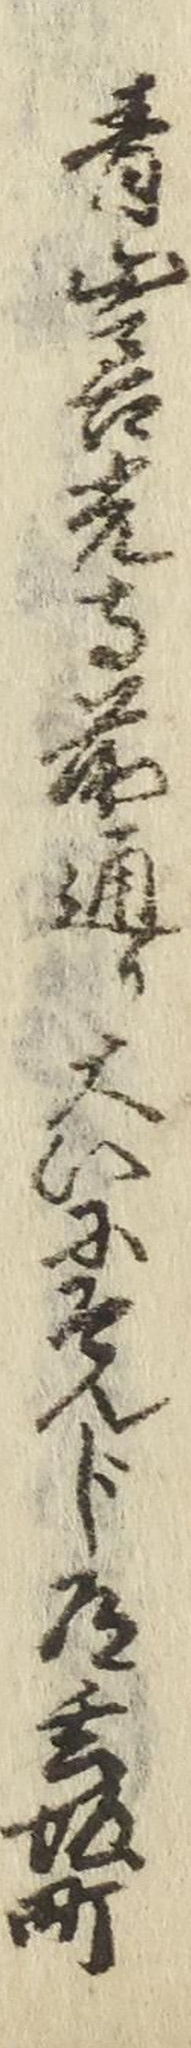青山善光寺前通り大いにそんじ道玄坂町
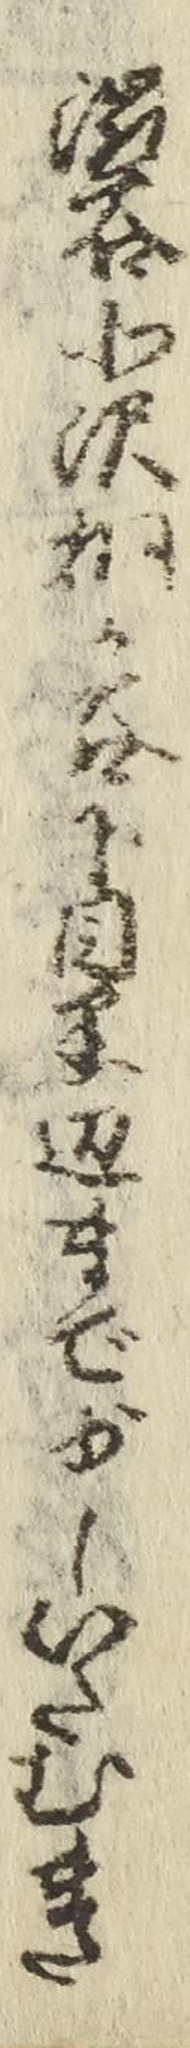渋谷北沢桐ヶ谷下目黒辺まで少しいたむまた
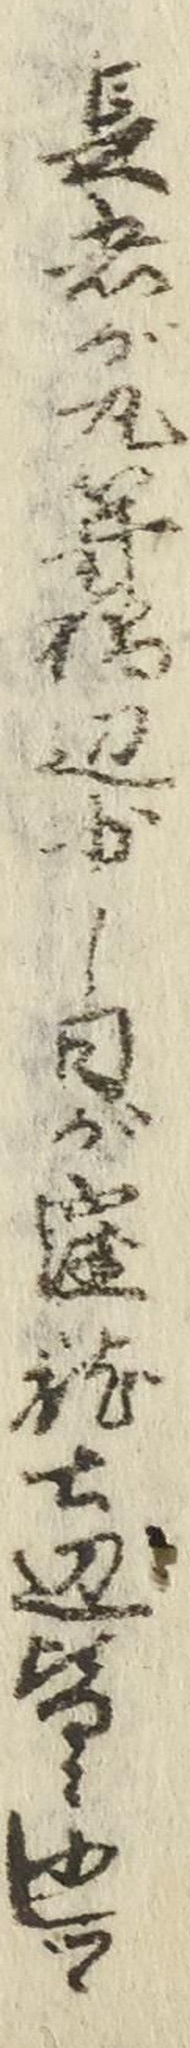長者が丸笄橋辺少し日が窪龍土辺皆々少しツゝ
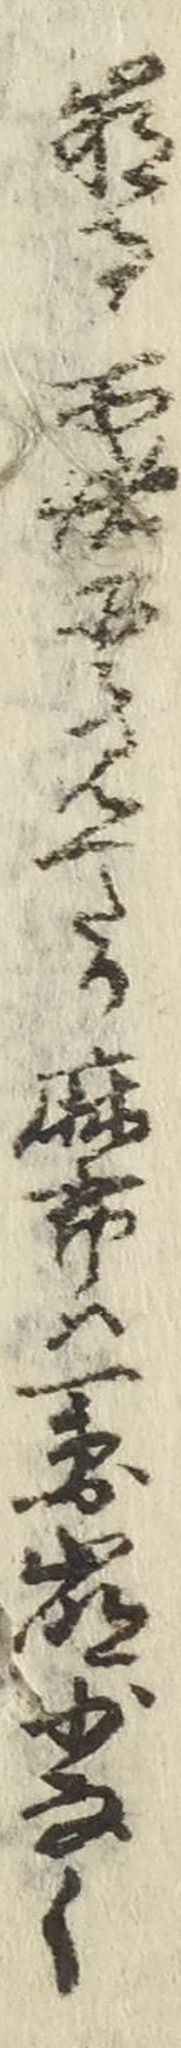崩る堂所諸所見へたり麻布は一円崩少なく
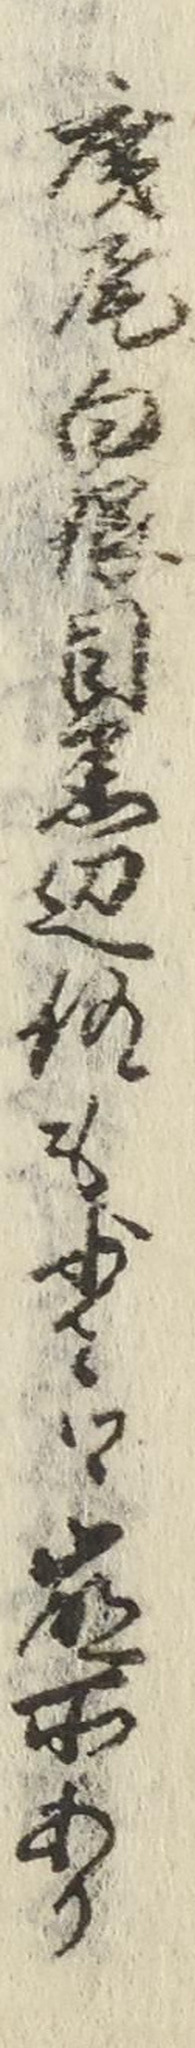広尾白銀目黒辺何も少々ツゝ崩所あり
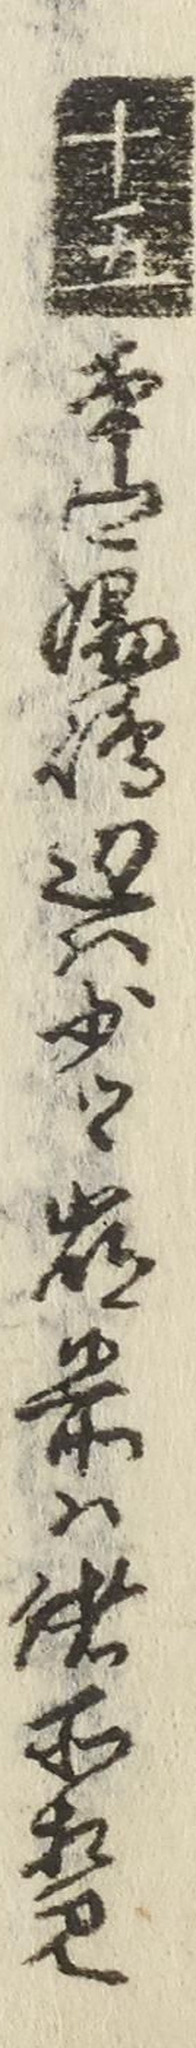十五本郷湯嶋辺は少ツゝ崩候所は諸所相見
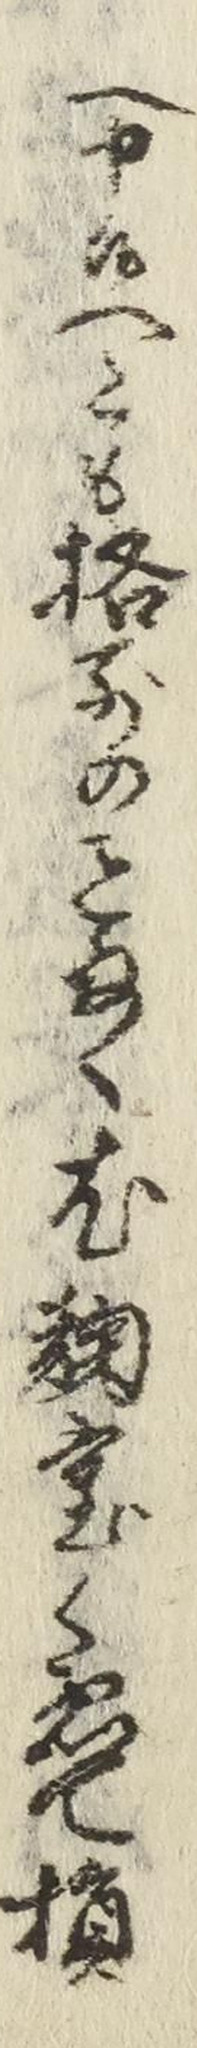へ申候へとも格別のことなく尤麹室くゑて損
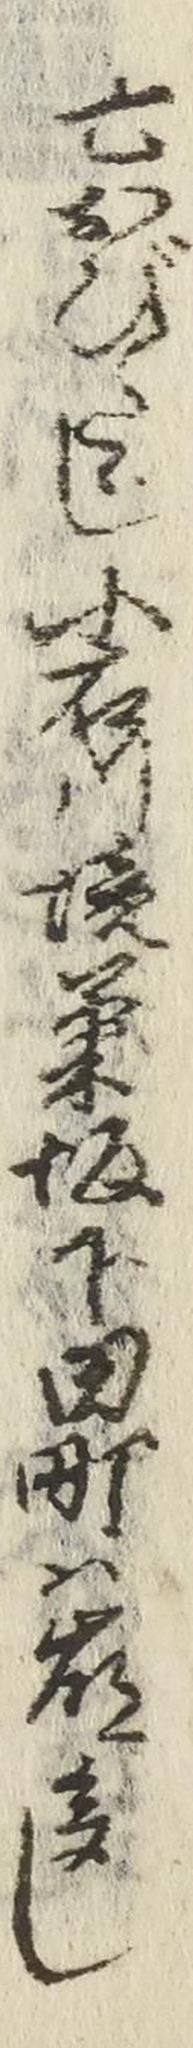亡おびたゝし小石川境菊坂下田町は崩多し
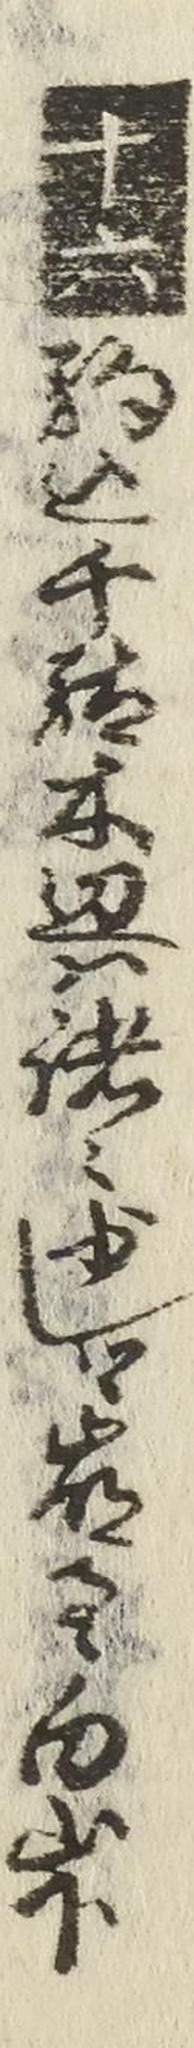十六駒込千駄木辺は諸々少しツゝ崩るゝ白山下
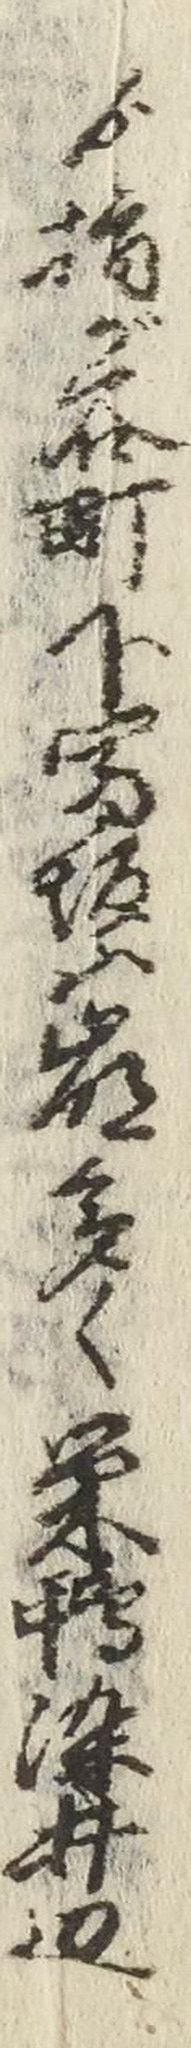ゟ指が谷町下富坂は崩多く巣鴨染井辺
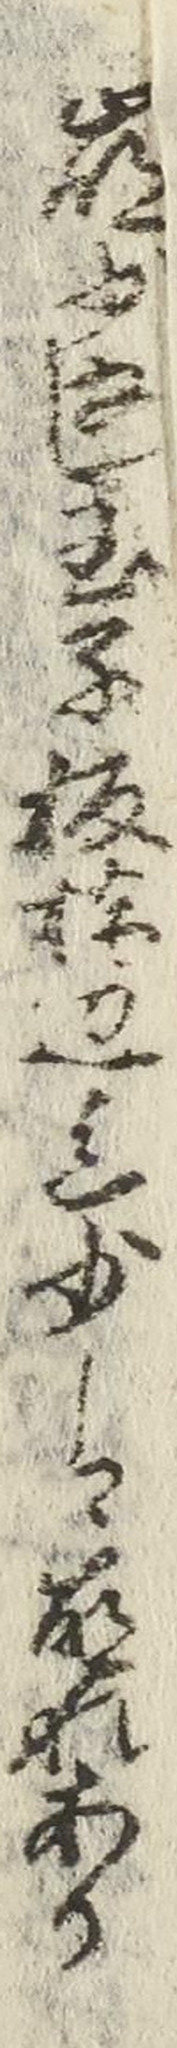崩少なし王子板橋辺迄少しツゝ崩れあり
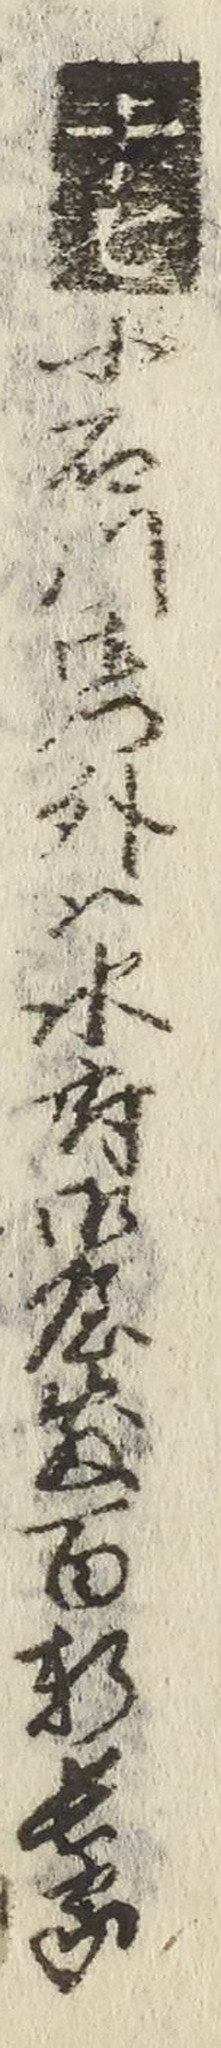十七小石川御門外は水府御屋敷百軒長家
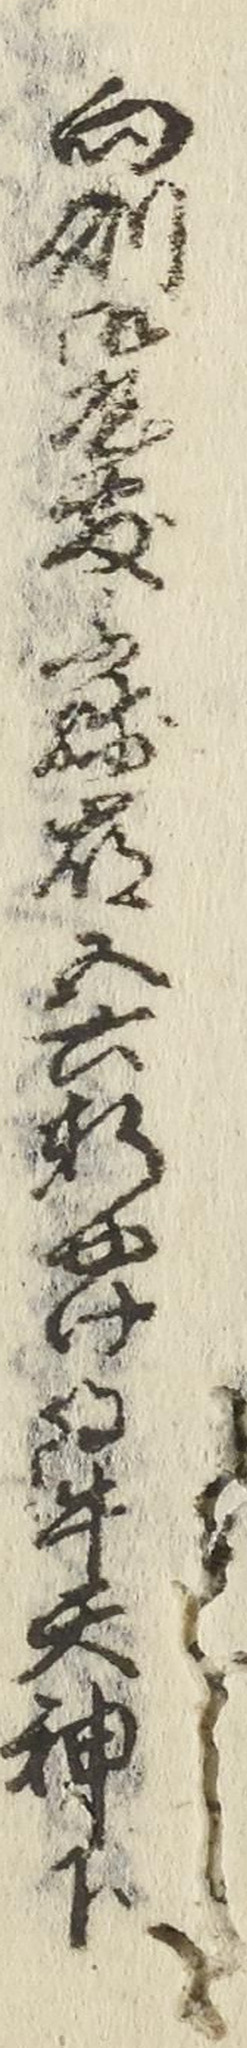向側御屋敷不残崩五六軒やける牛天神下
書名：地震出火　男女死人怪我人書上之寫
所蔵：東京大学地震研究所図書室 Earthquake Research Institute Library, The University of Tokyo, JAPAN
